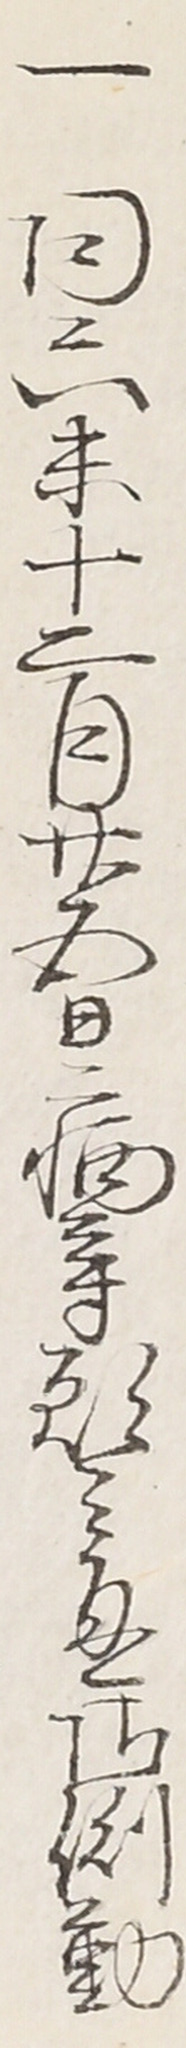一同六未十二月廿五日病気願之通御側勤
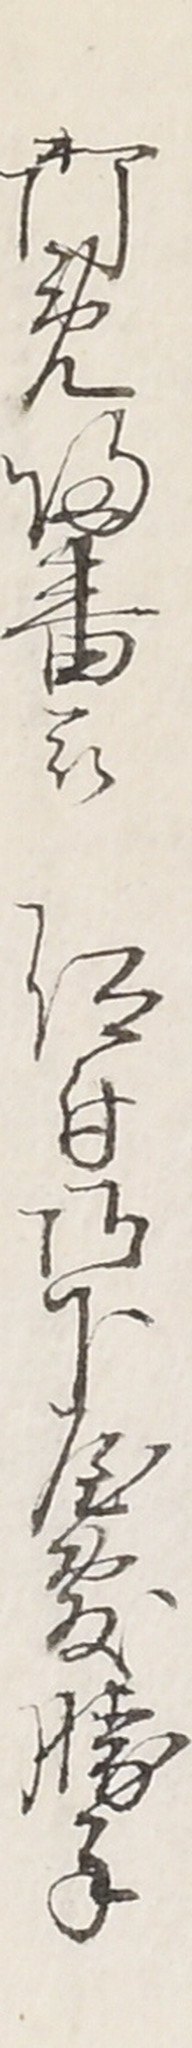御免帰番被仰付御下屋敷勝手
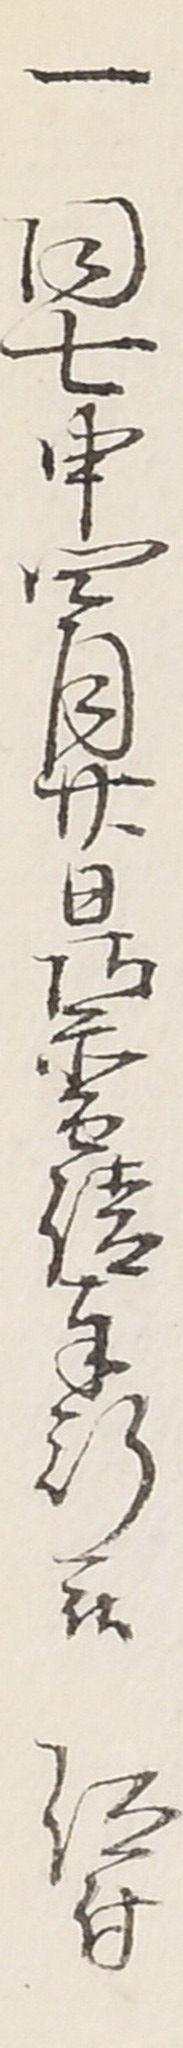一同七申四月廿日御普請奉行被仰付
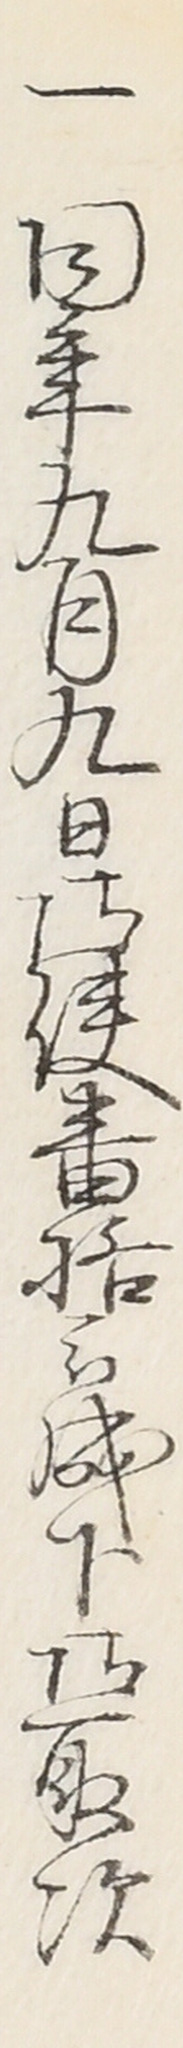一同年九月九日御使番格被成下御取次
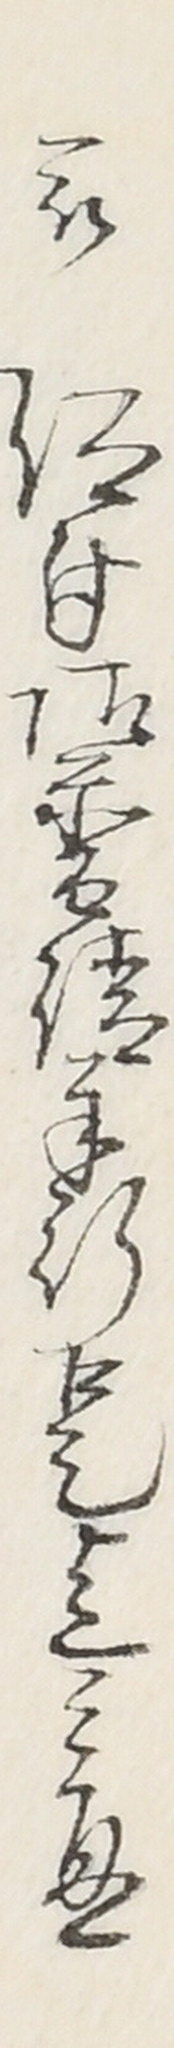被仰付御普請奉行是迄之通
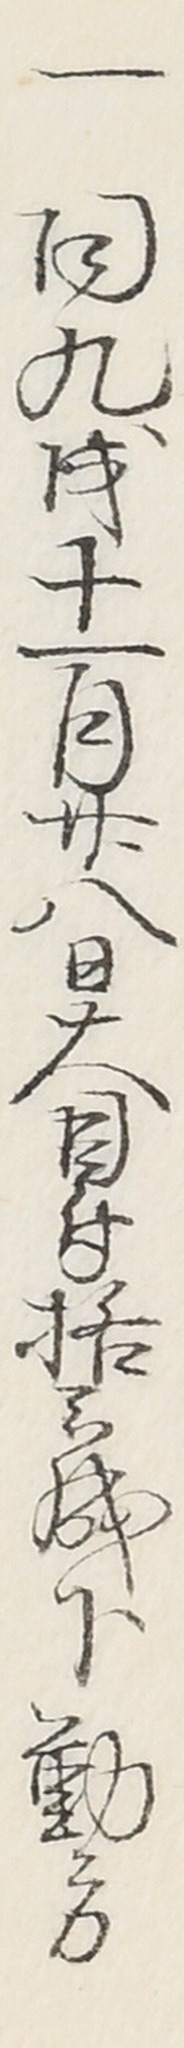一同九戌十一月廿八日大目付格被成下勤方
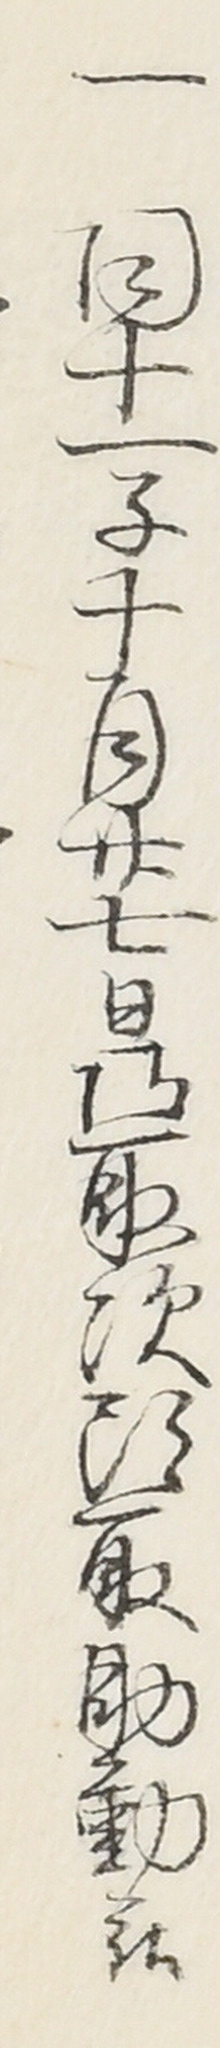一同十一子十月廿七日御取次頭取助勤被
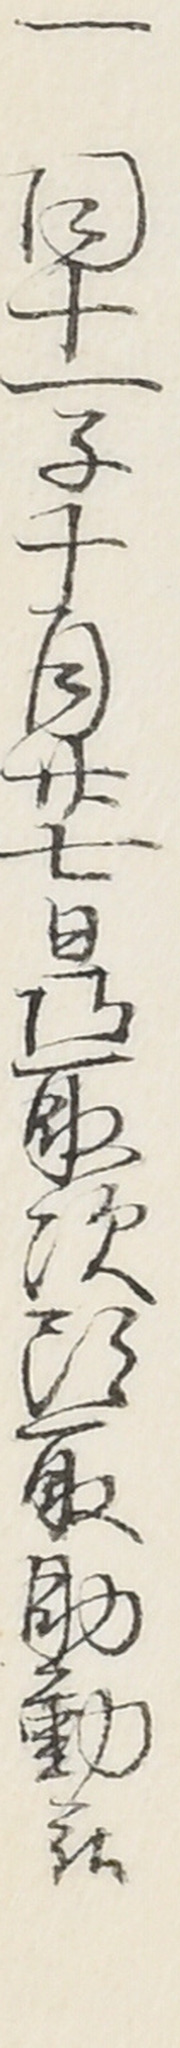一同十一子十月廿七日御取次頭取助勤被
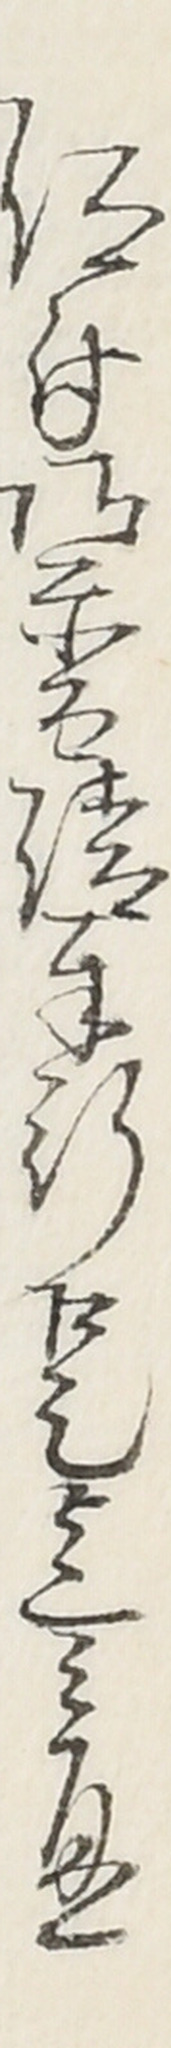仰付御普請奉行是迄之通
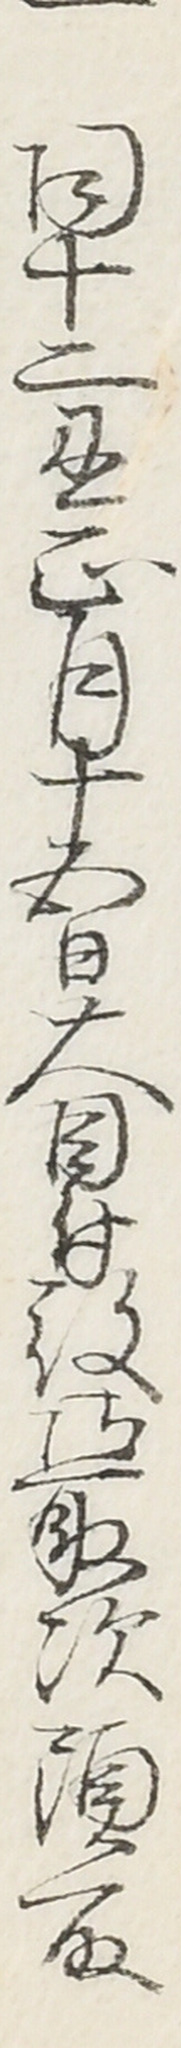一同十二丑正月十五日大目付役御取次頭取
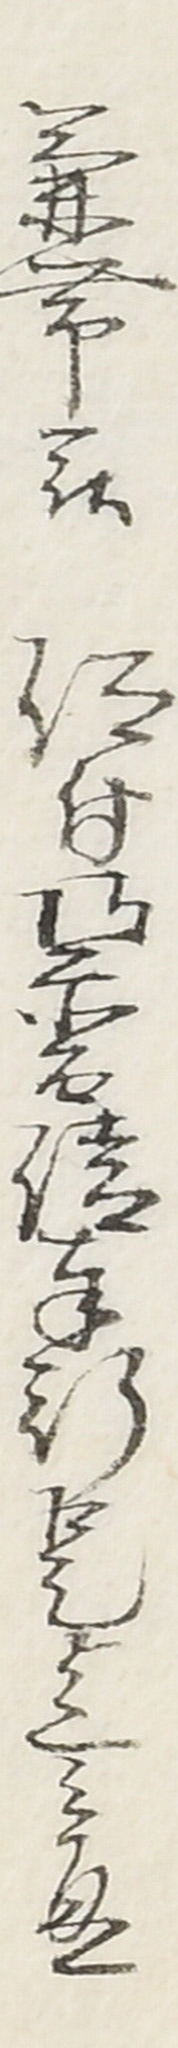兼帯被仰付御普請奉行是迄之通
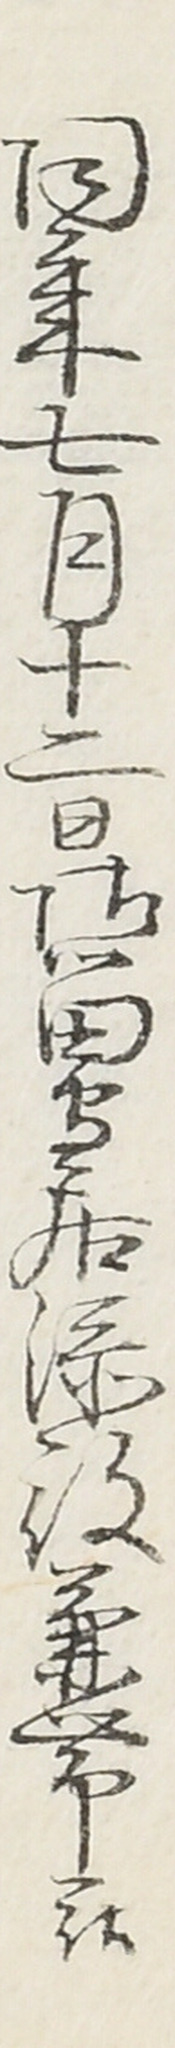一同年七月十二日御留守居添役兼帯被
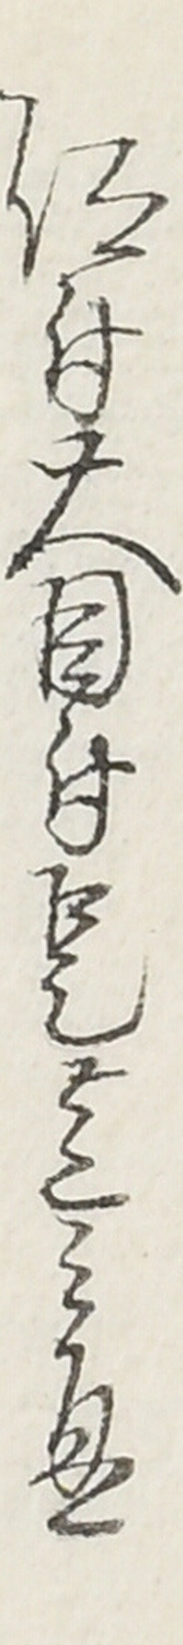仰付大目付是迄之通
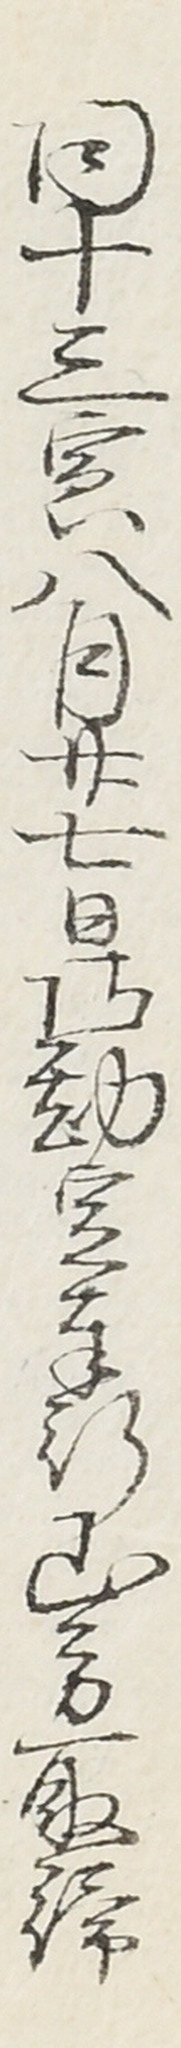一同十三寅八月廿七日御勘定奉行山方取締
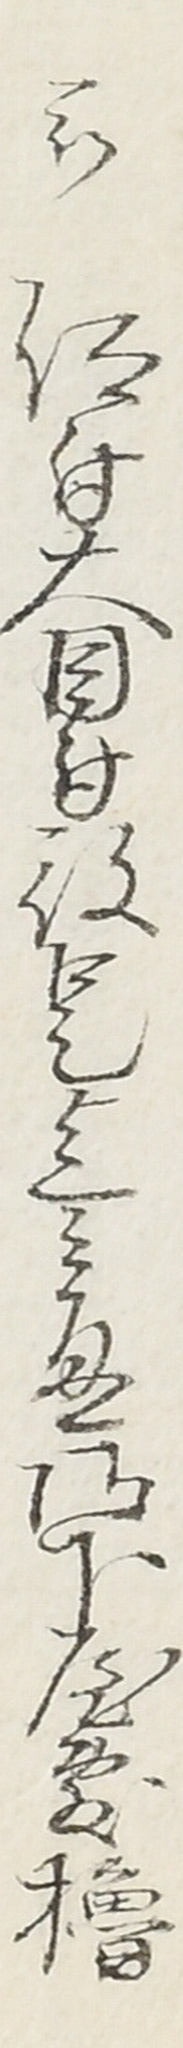被仰付大目付役是迄之通御下屋敷櫓
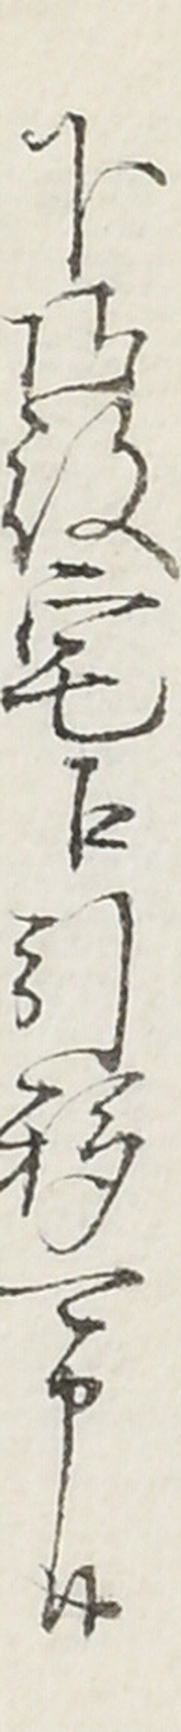下御役宅江引移可申候
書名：給人諸士勤仕録（七）
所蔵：伊那市立高遠町図書館・合同会社AMANE
